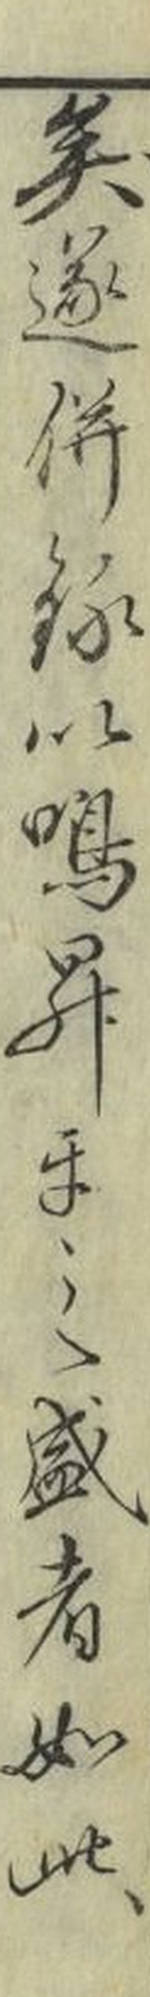矣、遂併録以鳴昇平之盛者如此、
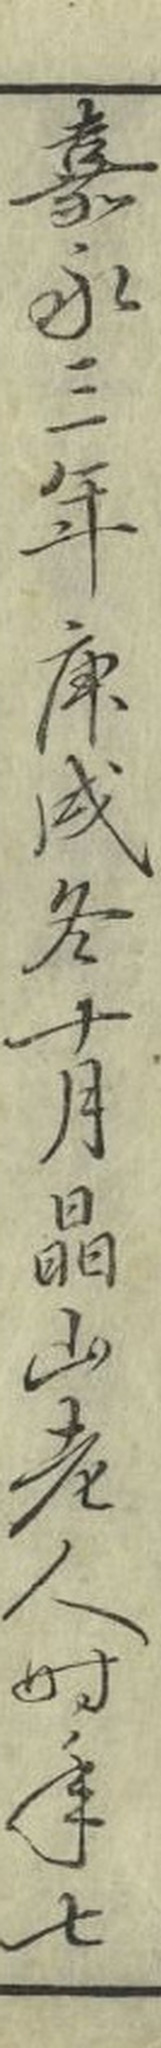嘉永三年庚戌冬十月晶山老人時年七
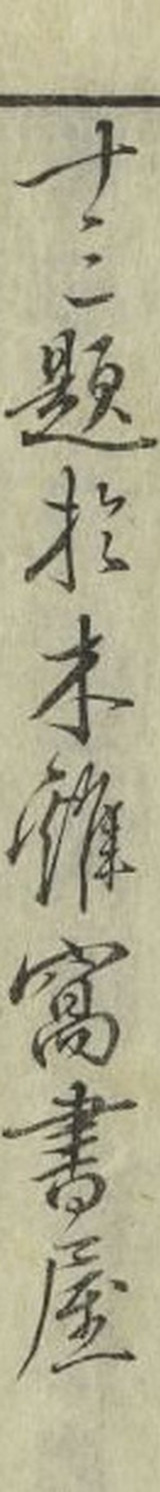十三題於木雞窩書屋
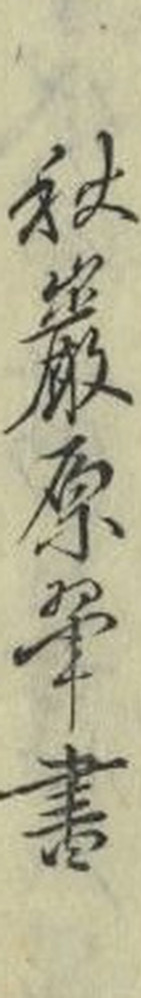秋巌原翬書
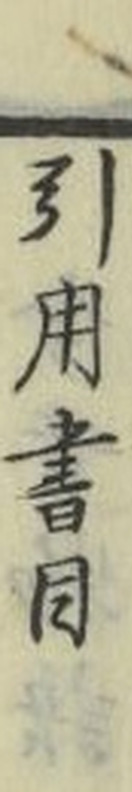引用書同
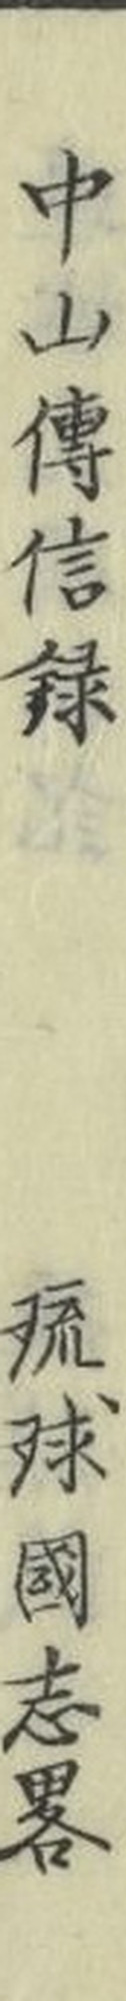中山伝信録琉球国志略
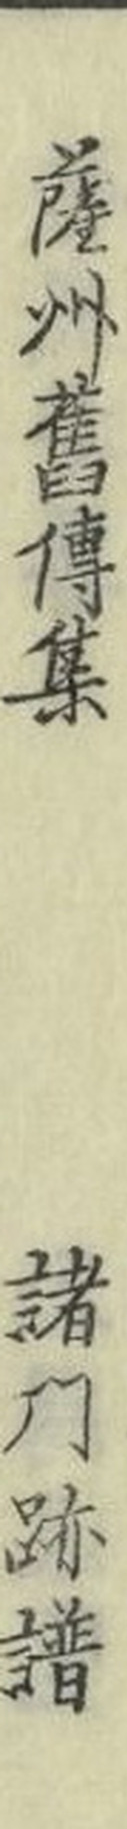薩州旧伝集諸国跡譜
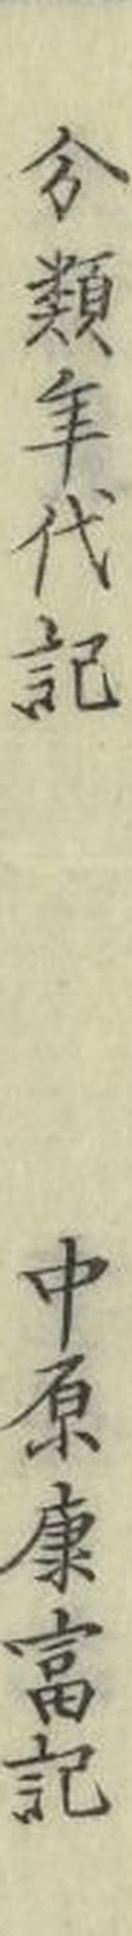分類年代記中原康富記
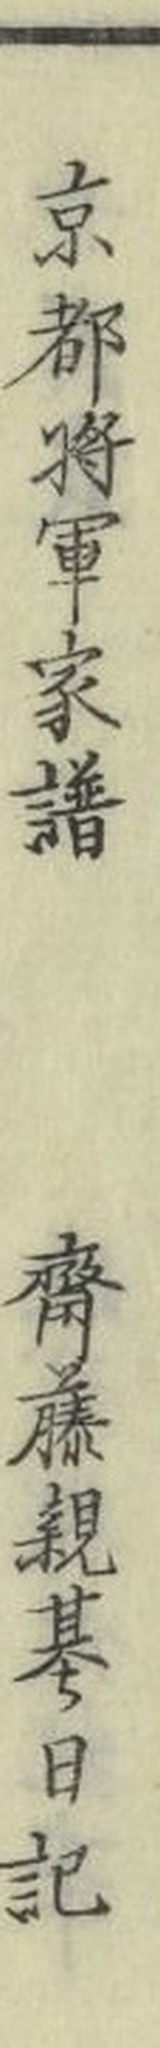京都将軍家譜斎藤親基日記
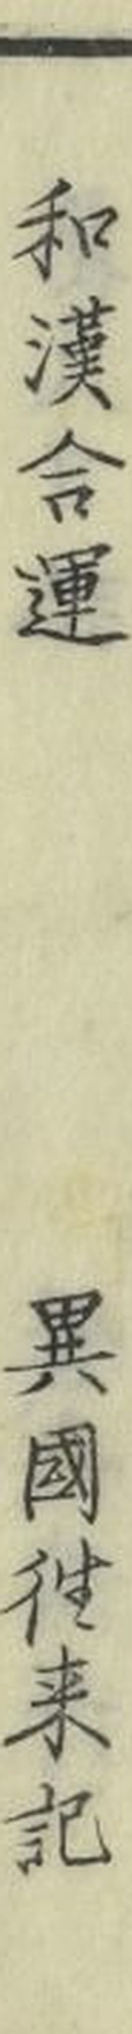和漢合運異国往来記
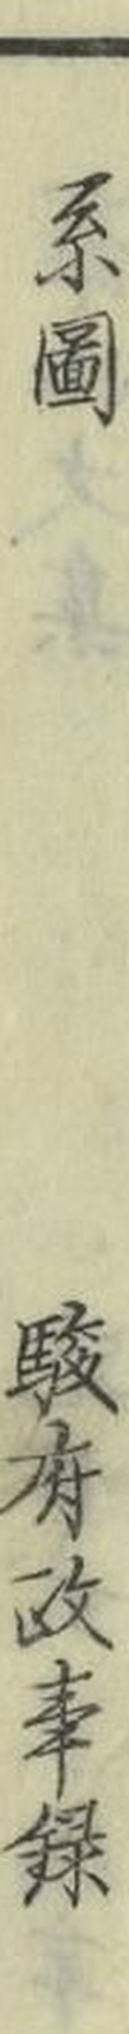系図駿府政事録
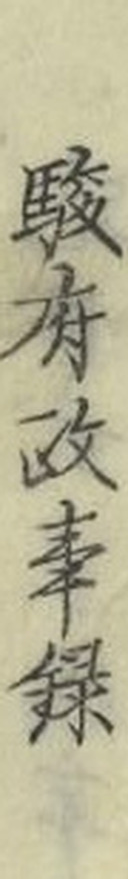系図駿府政事録

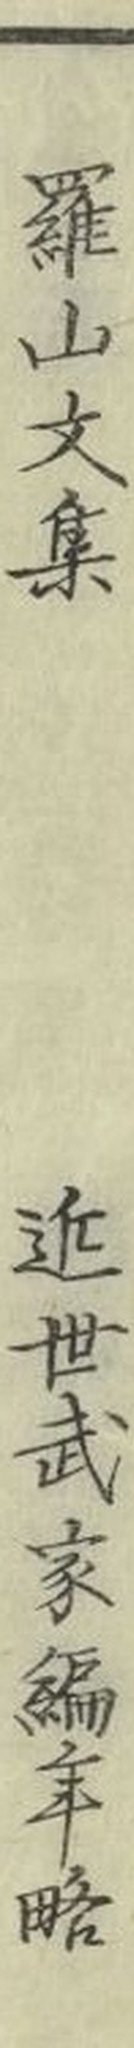羅山文集近世武家編年略
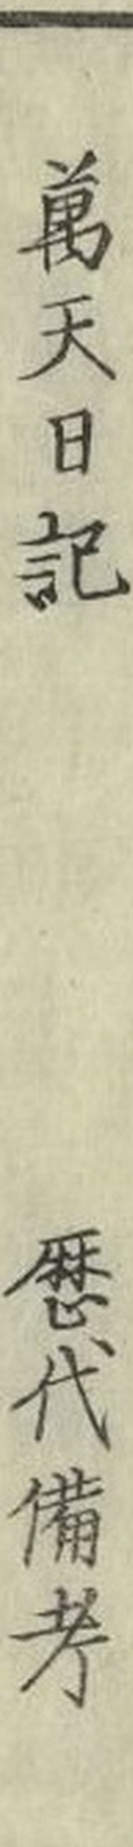万天日記暦代備考
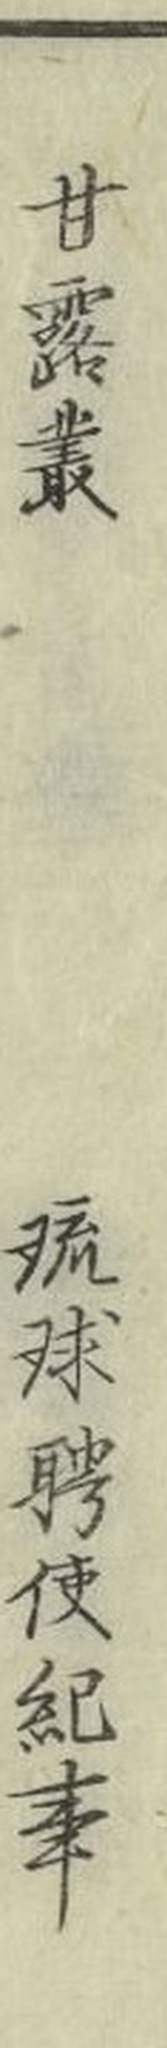甘露叢琉球聘使紀事
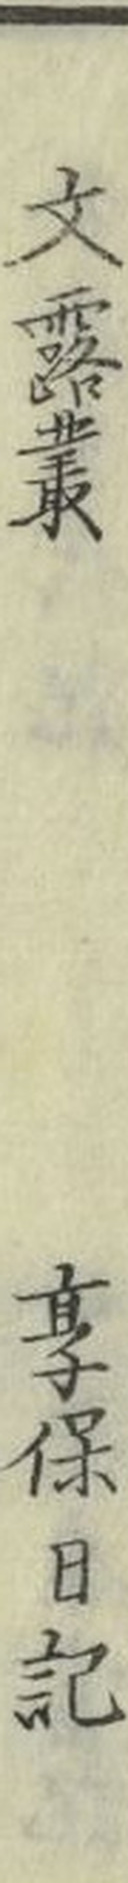文露叢享保日記
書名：琉球入貢紀略
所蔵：University of the Ryukyus Library
